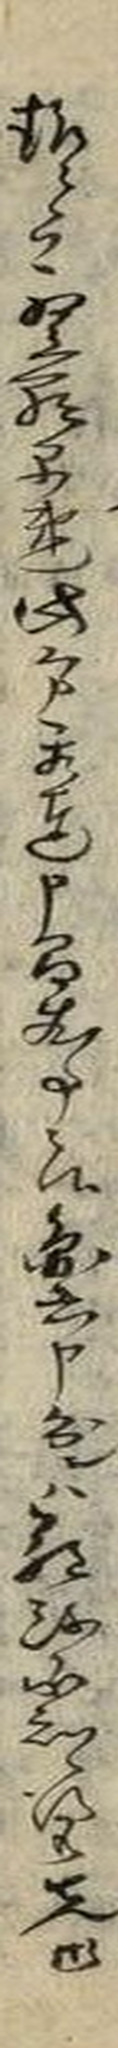趣に候はゝ翌朝早速此方へ相達申間敷事に候円六申分れは難致承知候得共先御
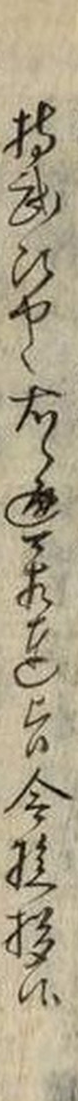持武頭中へ右之通可相達候旨令挨拶候
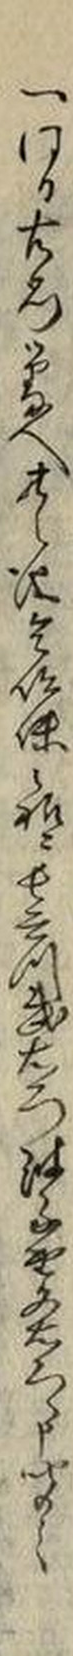一同日右御門御番人共之儀令吟味候様に長谷川武左衛門波多野文右衛門へ申聞之
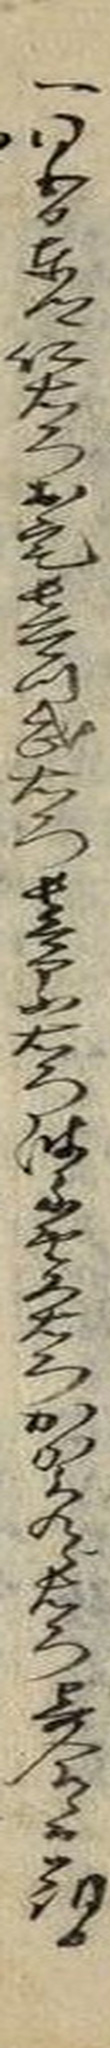一同五日東郷仁右衛門於宅長谷川武右衛門長谷部小右衛門波多野文右衛門加賀九郎右衛門寄合候而朔日
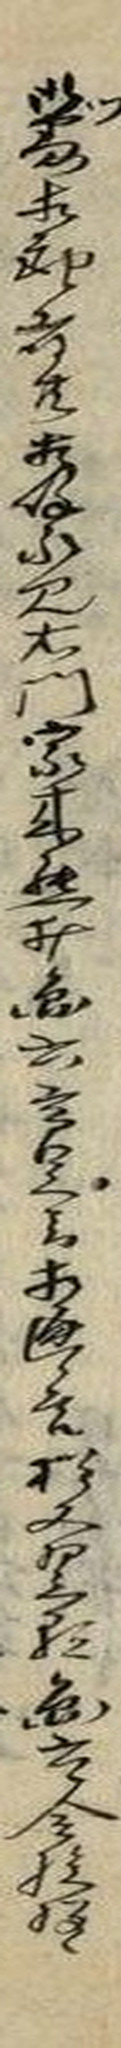御門番相勤候者共相呼永見右門家来熊井円六高足に而相通候節猶又足駄円六令挨拶候
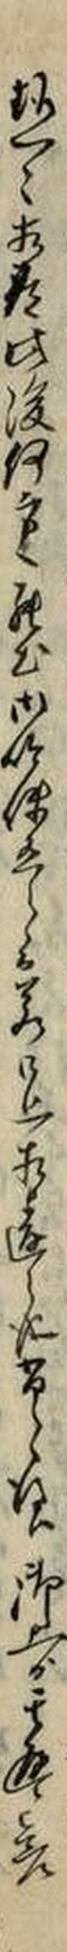趣一々相尋此後何方へ罷出御吟味有之候而若口上相違之儀有之候得は御上ゟ其通に被差
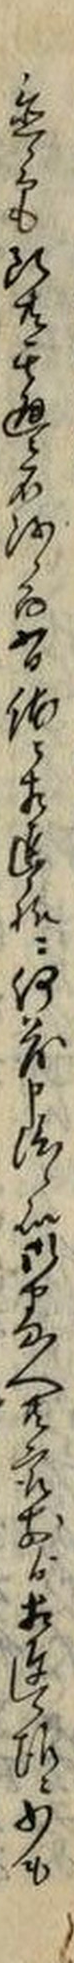置候而も頭共其通に不致候間有体に相達候様に何も申渡候処御番人共最前ゟ相達候趣に少も
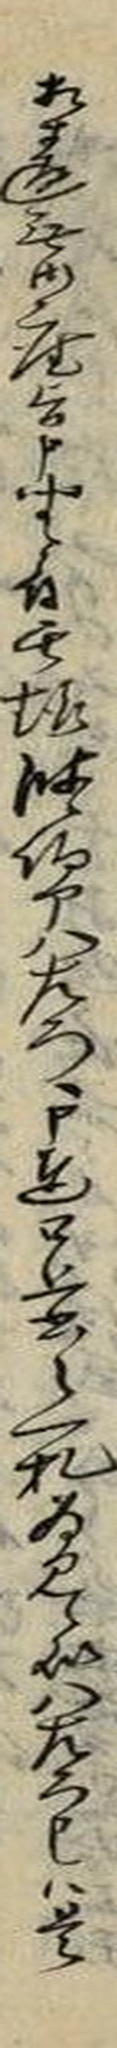相違無御座候旨申聞候に付其趣波々伯部八左衛門へ申達口上書之一札為見候処八左衛門申候は是
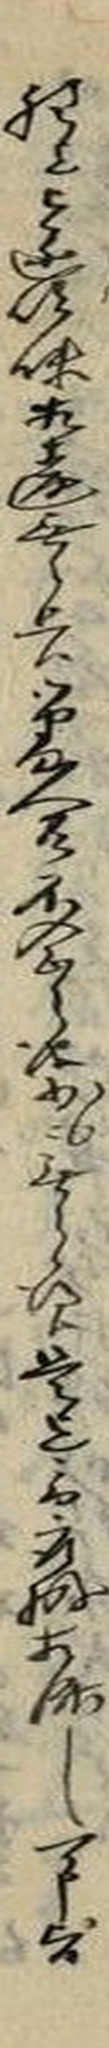程迄被遂吟味相違無之上は御番人共不咎候儀少も無之候得は是迄に而取扱相済之可申旨
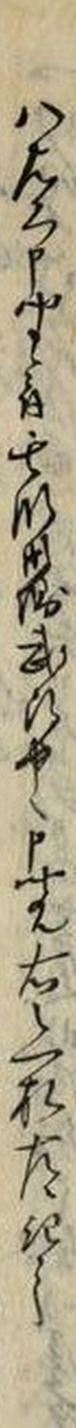八左衛門申聞候に付其段御側武頭中へ申聞ル右之一札左に記之
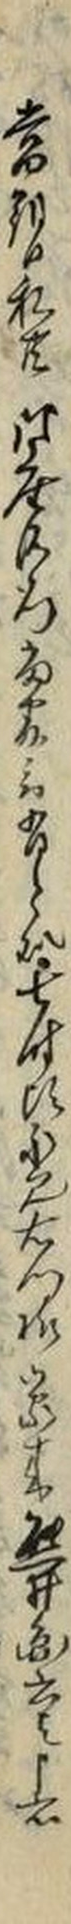当朔日私共御座所御門当番に而有之候処七時頃永見右門様御家来熊井円六と申者
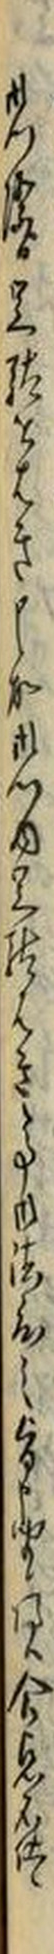御門際ゟ足駄をはき申故御門内足駄はき候事御法度之旨申聞候得ハ合点不仕候
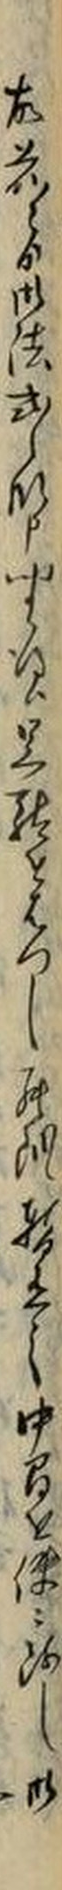故前々ゟ御法度之段申候得は足駄をはつし罷越候暫有之中間を使に致し御
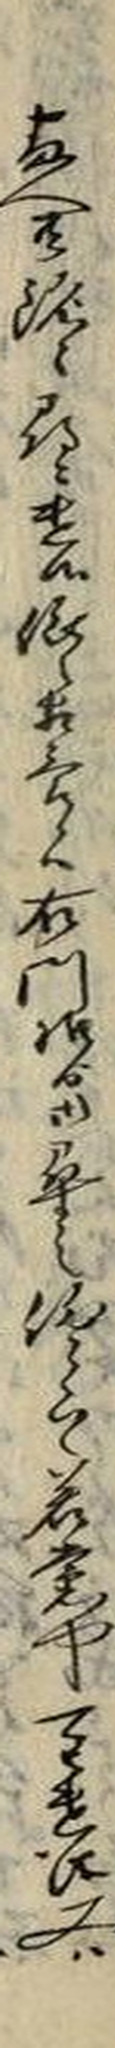番人共銘々尋に遣候依之相答候は右門様ゟ御尋之儀に候はゝ若党中可被遣候儀又は
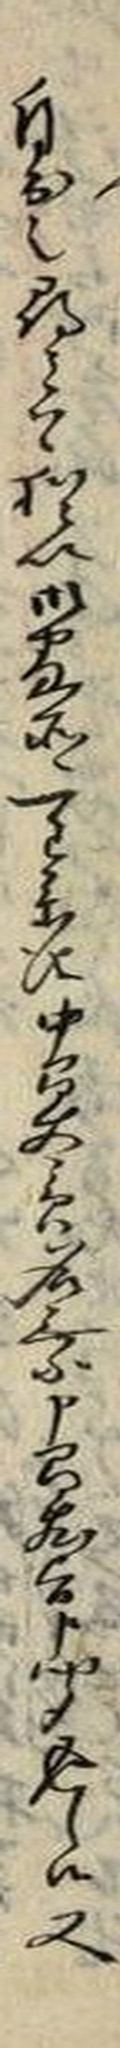自分之尋に候はゝ猶以御番所へ可被参候儀中間使に而は名乗申間敷旨申聞返し候又
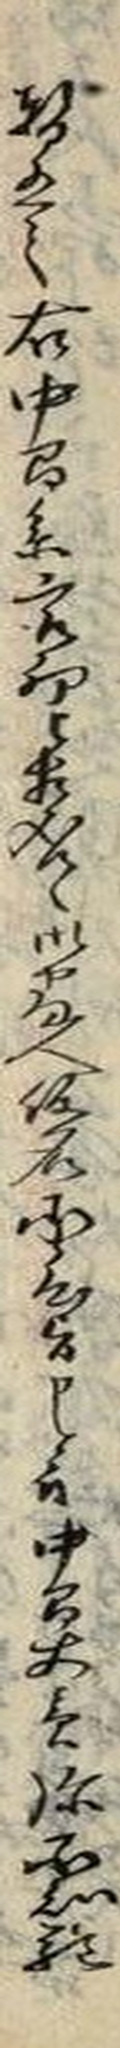暫有之右中間参最初被相咎候御番人仮名承度旨申に付中間使に而は弥承知難
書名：御門御櫓之部
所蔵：福井県文書館 Fukui Prefectural Archives
